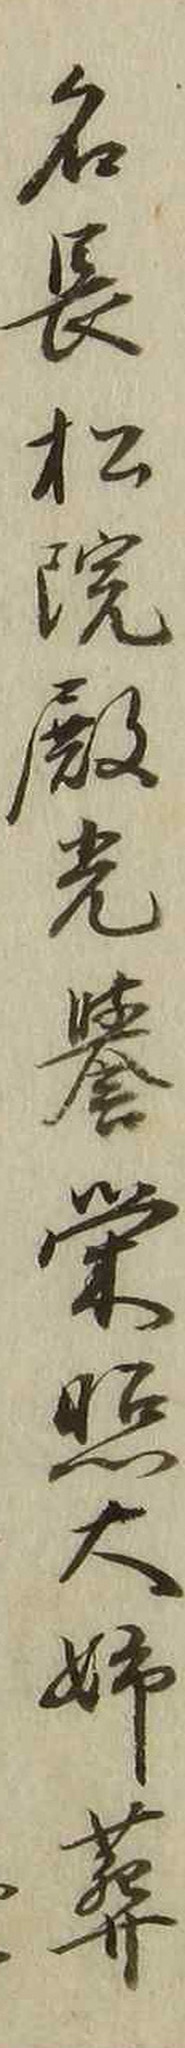名長松院殿光輿誉栄照大姉葬
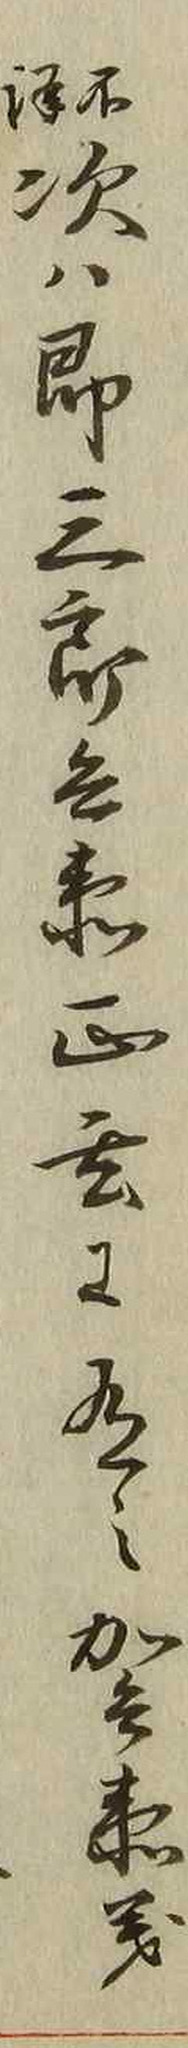不詳次は即三郎兵衛正玄に有之加兵衛義
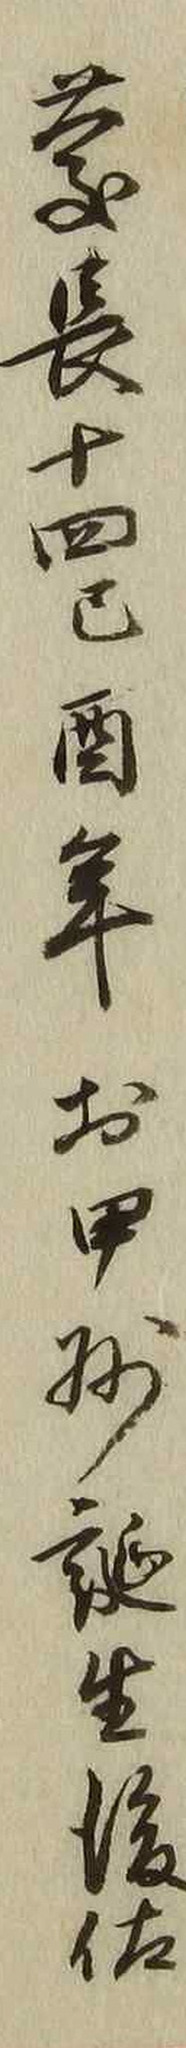慶長十四巳酉年於甲州誕生後佐
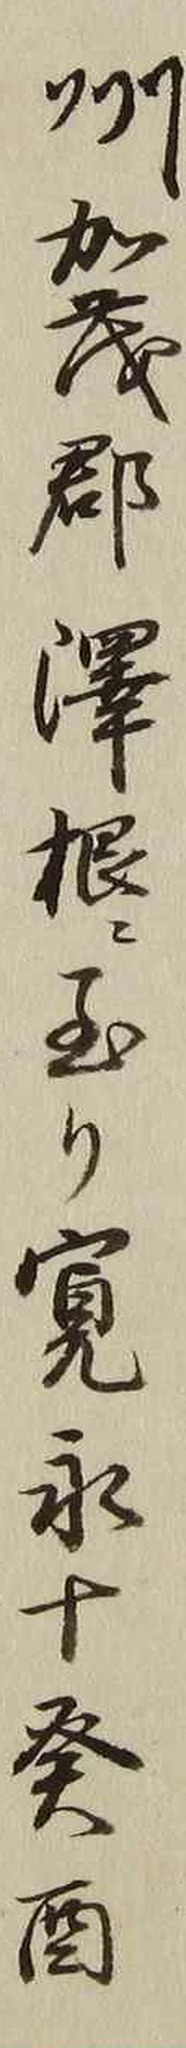州加茂郡澤根に至り寛永十癸酉
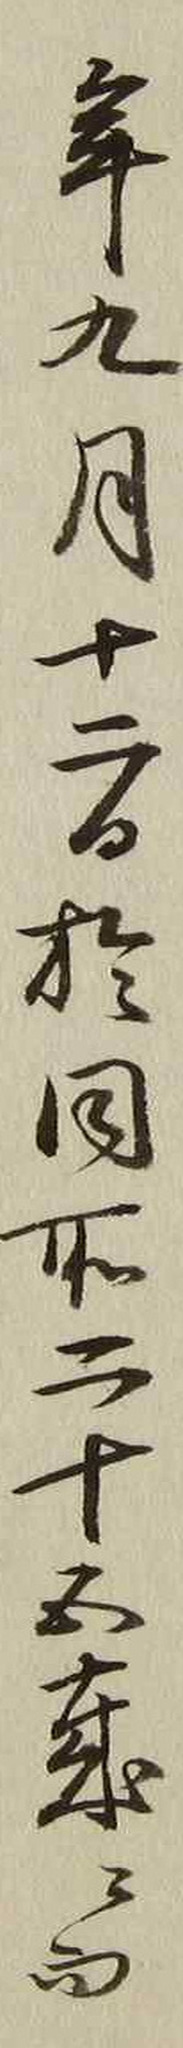年九月十二日於同所二十五歳に而
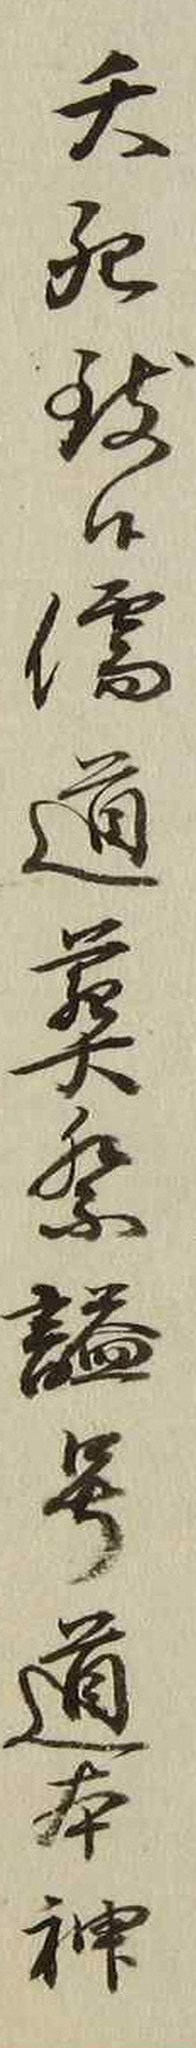夭死致候儒道葬祭諡号道本神
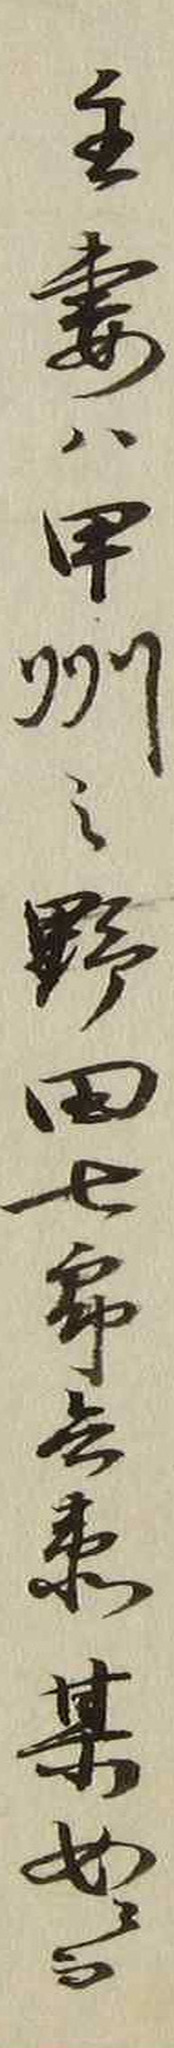主妻は甲州之野田七郎兵衛某女に而
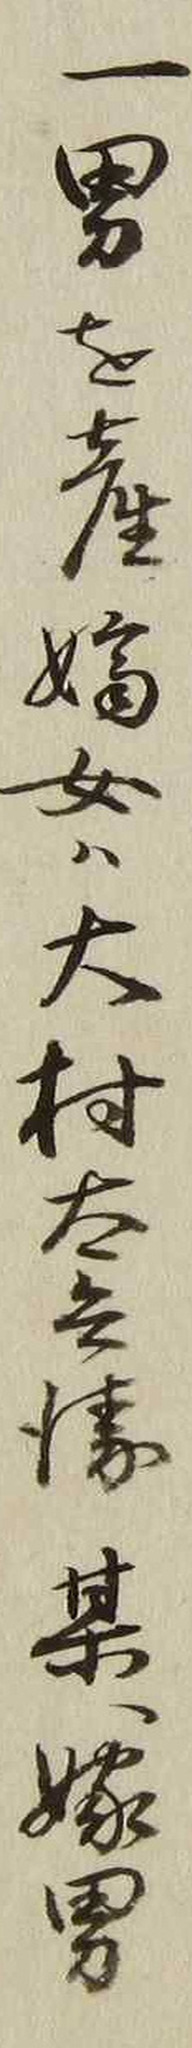一男を産嫡女は大村太兵衛某へ嫁男
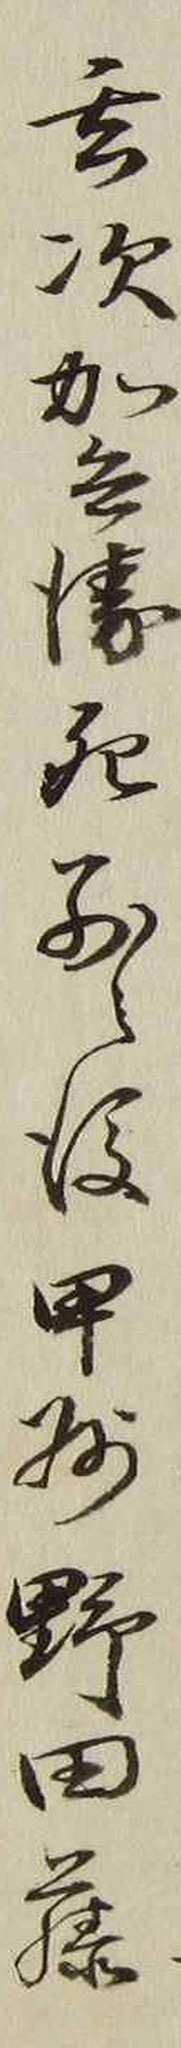玄次加兵衛死別後甲州野田藤
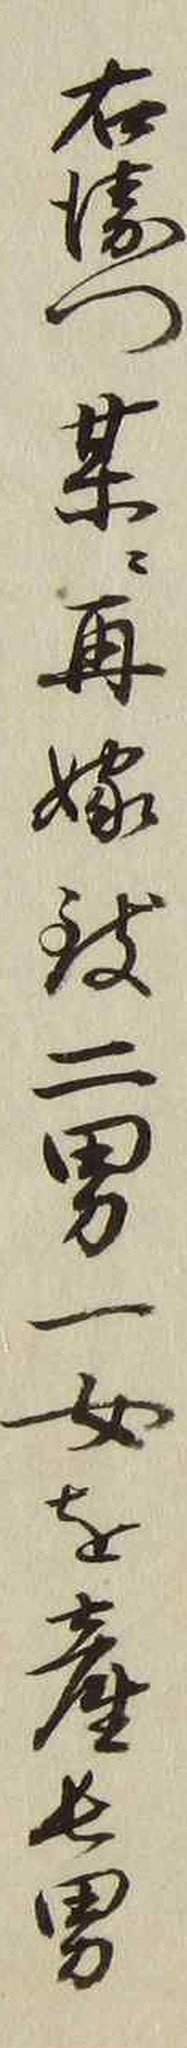右衛門某に再婚致二男一女を産長男
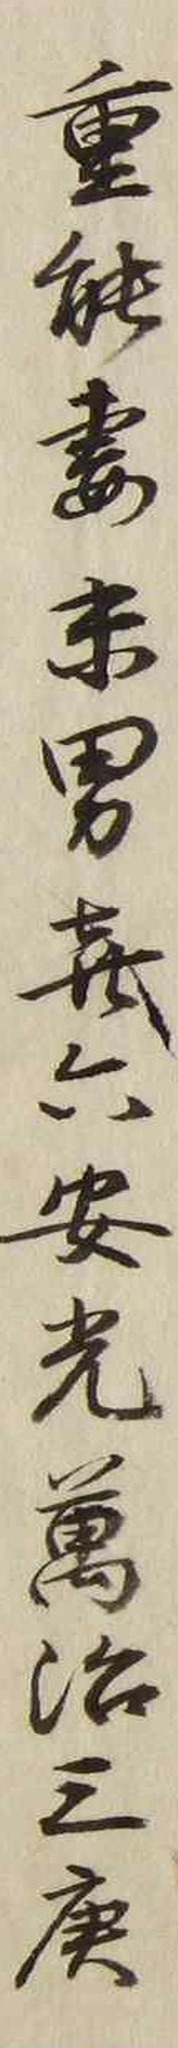重能妻末男喜六安光万治三庚

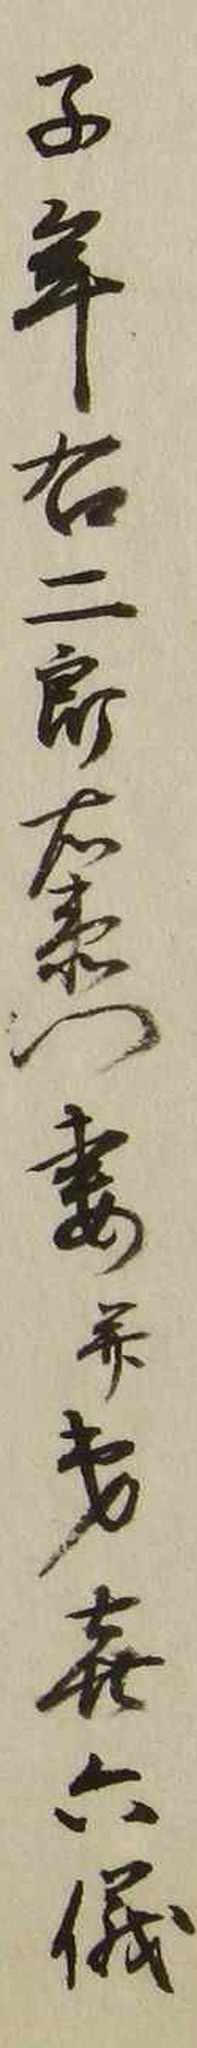子年右二郎右衛門妻并弟喜六儀
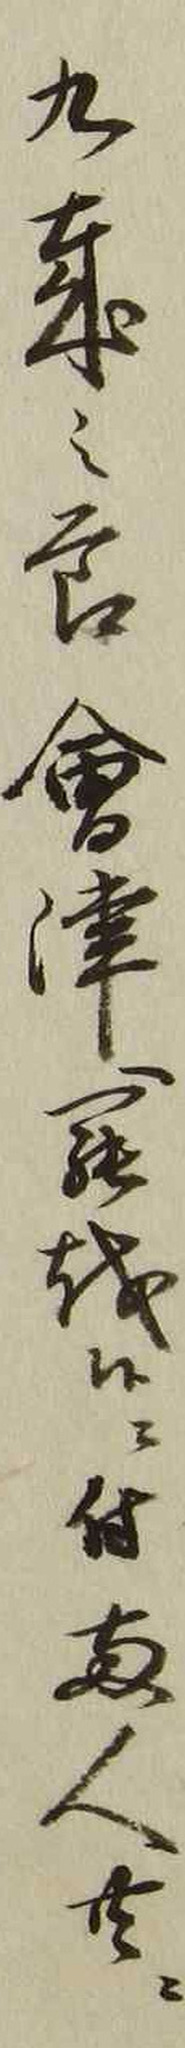九歳之節会津へ罷越候に付両人共に
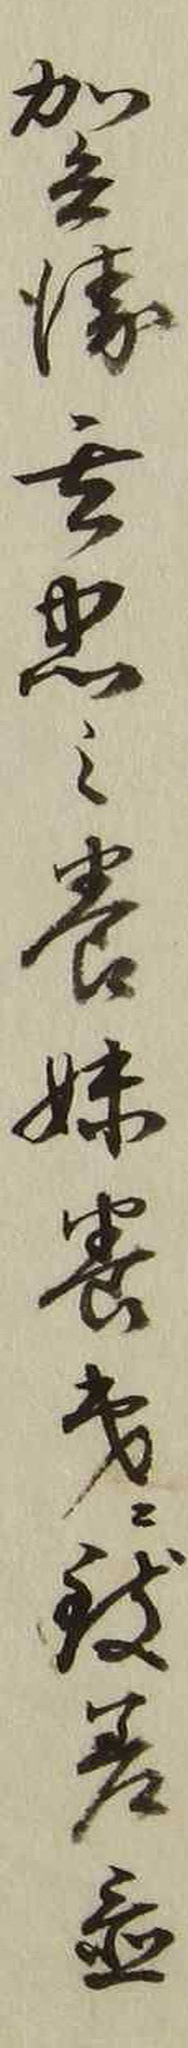加兵衛玄忠之養妹養弟に致差置
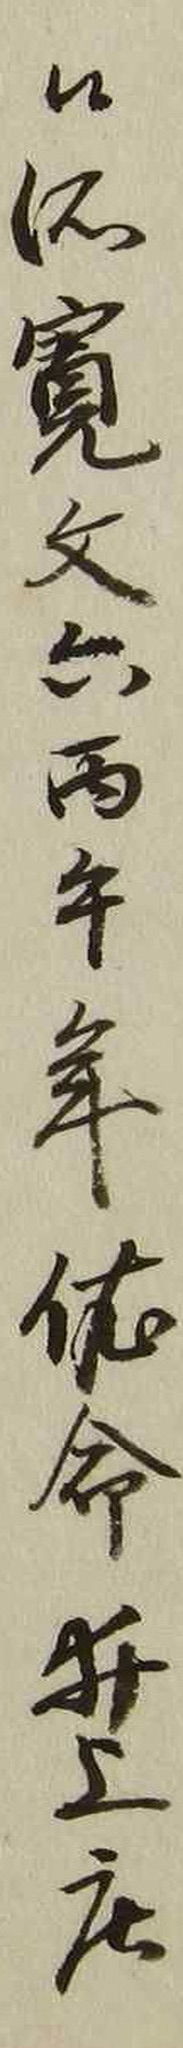候所寛文六丙午年依命井上庄
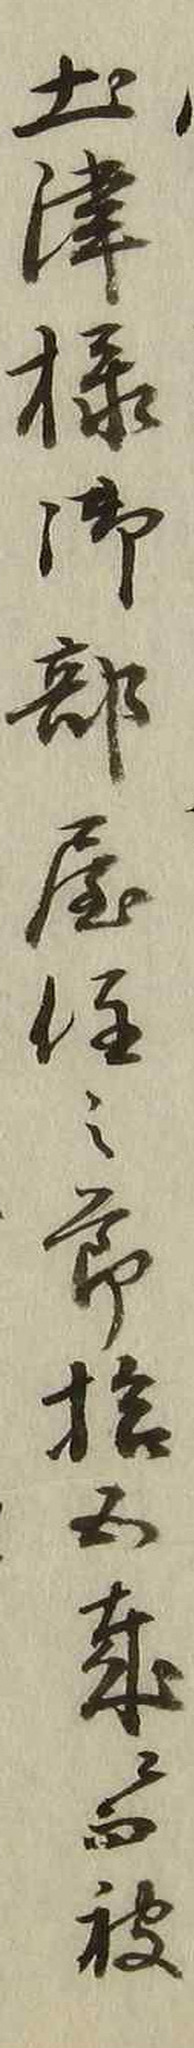土津様御部屋住之節拾五歳に而被
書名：諸士系譜　巻之125　た之部1
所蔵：会津若松市立会津図書館
